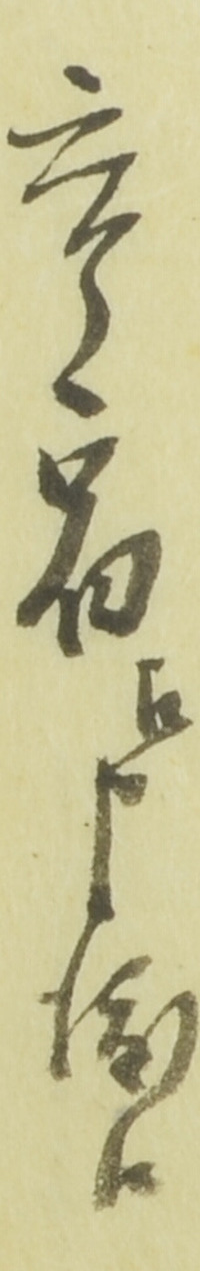六ヶ宿江申渡候
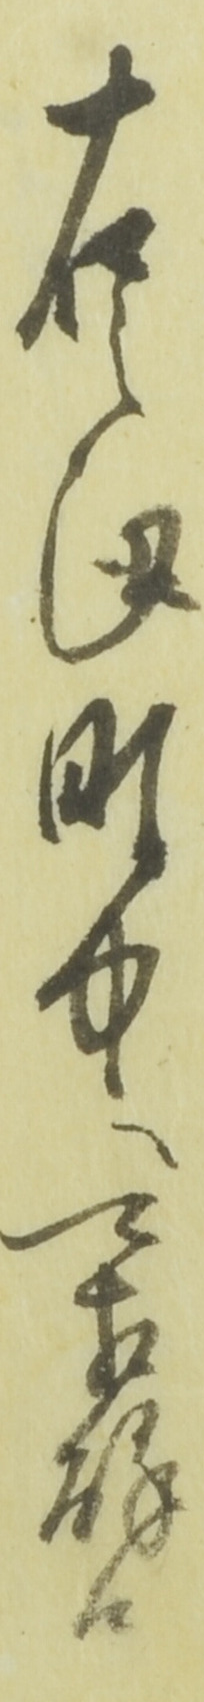右之趣町中へ可相触候
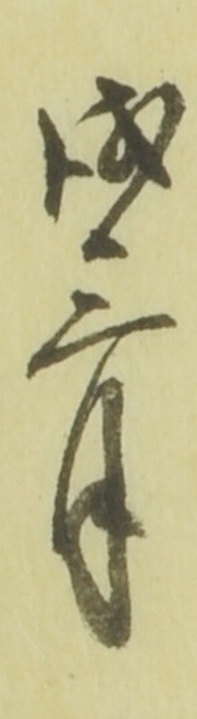戌三月
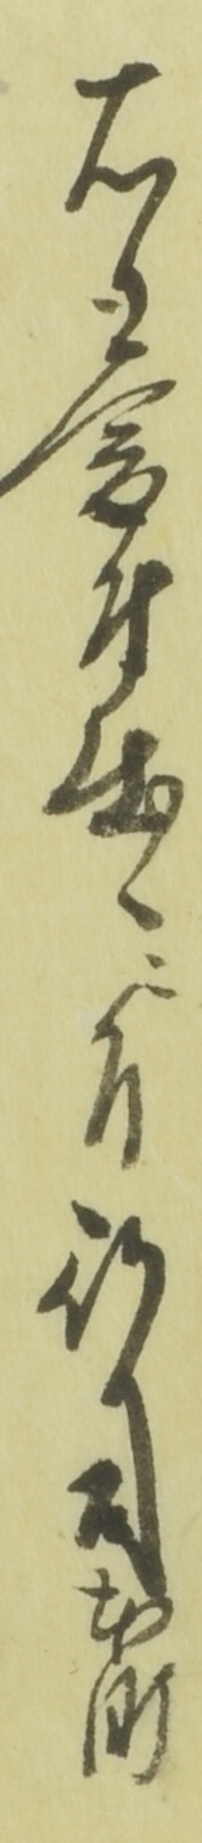右御書付出候ニ付行司本町
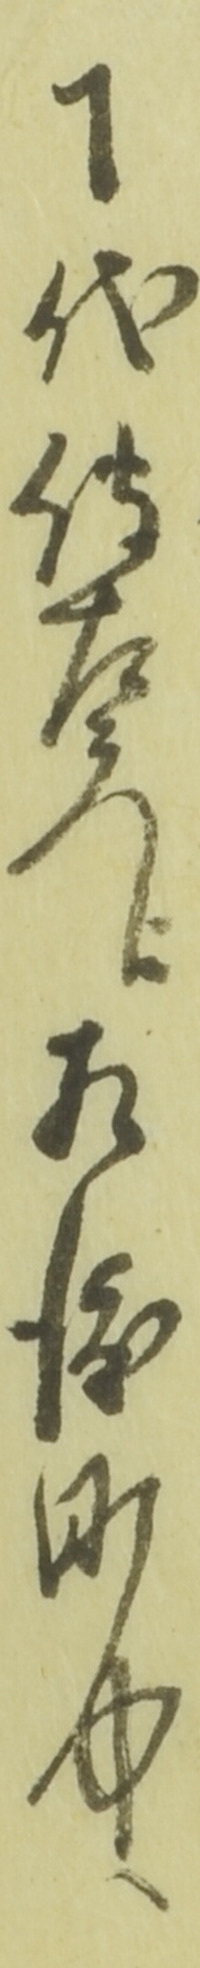丁代伝左衛門江相渡町中へ
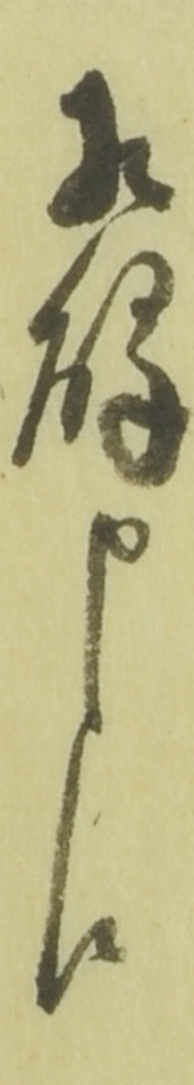相触申候
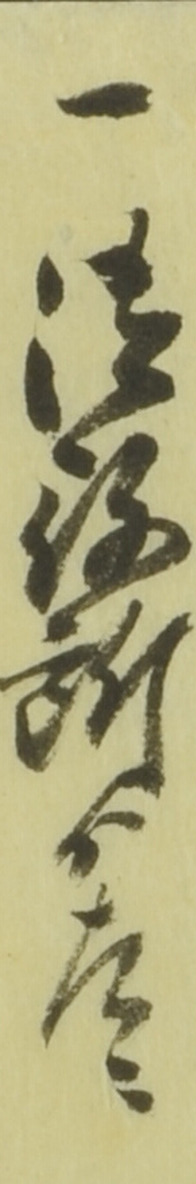一御役所ゟ左ニ
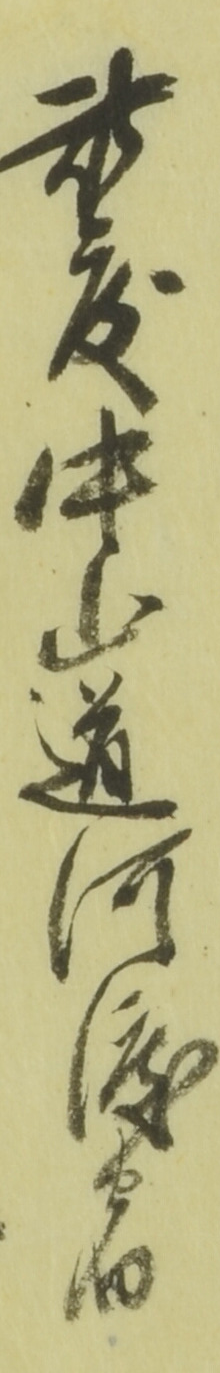此度中山道河渡宿
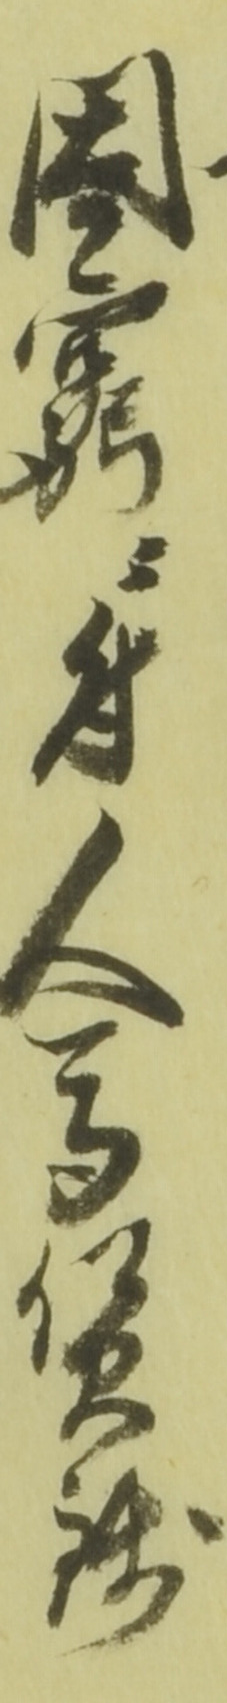困窮ニ付人馬賃銭
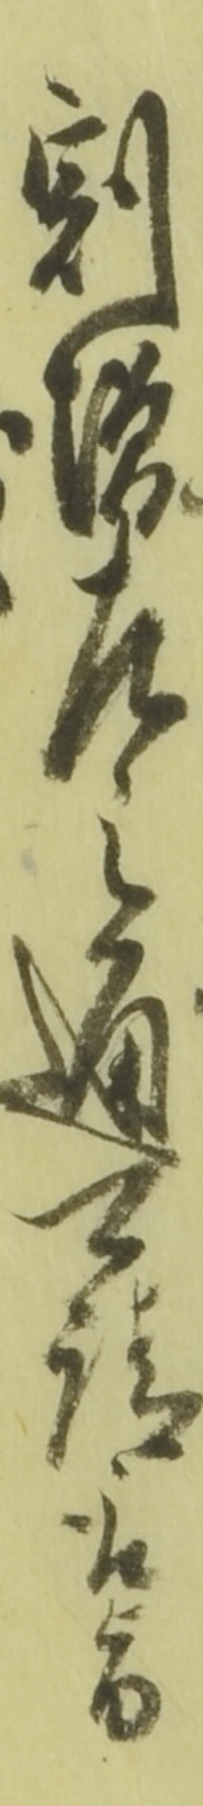割増左之通可請取旨

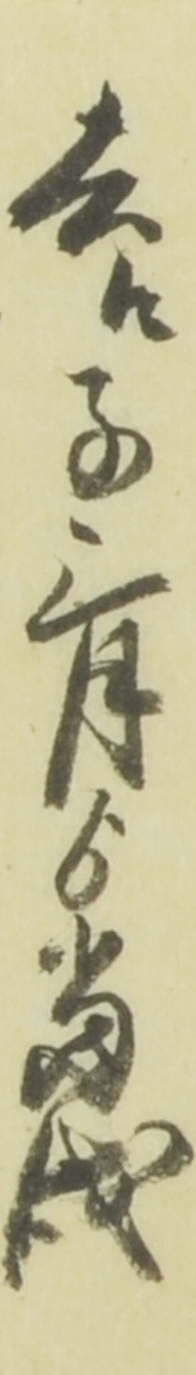去ル子三月ゟ当戌
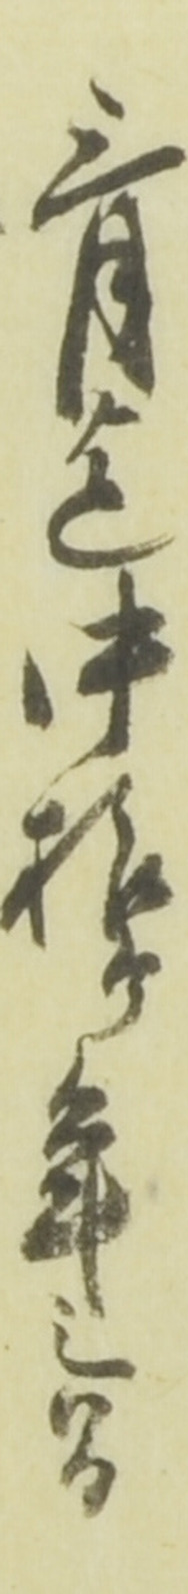三月迄中拾ヶ年之間
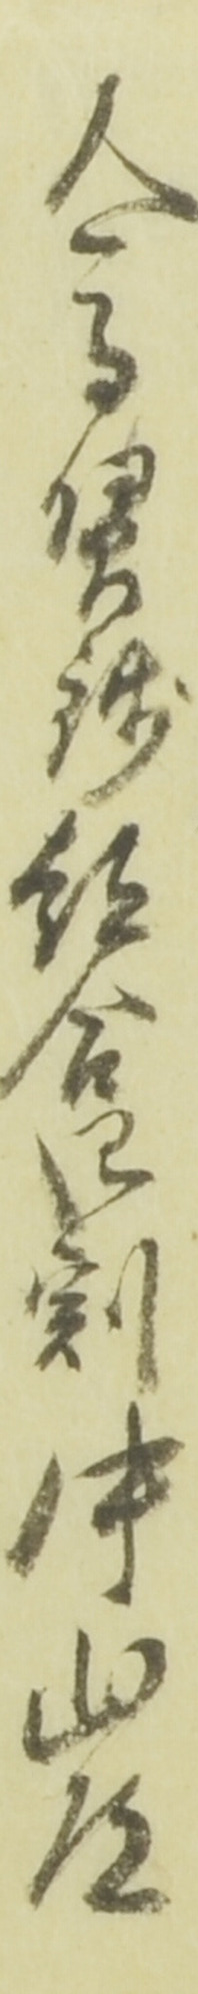人馬賃銭組合四割中山道
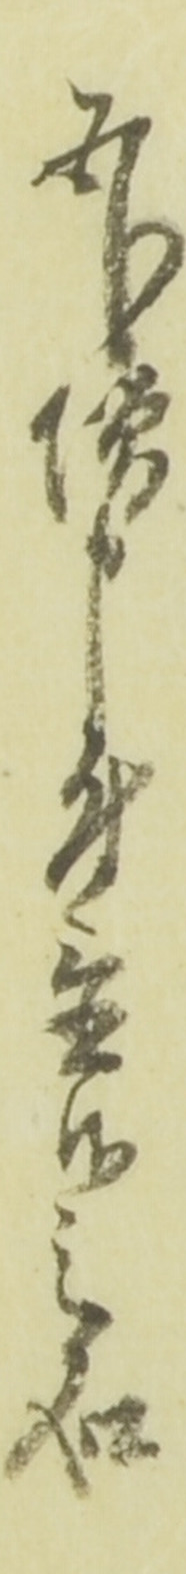五分増申付置候之処
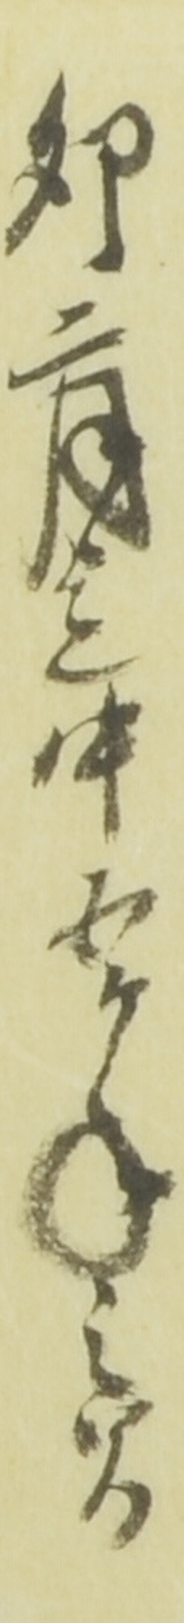卯二月迄中五ヶ年之間
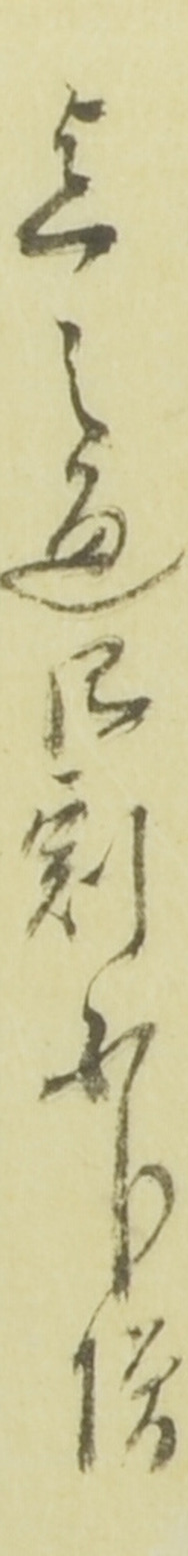迄之通四割五分増
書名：御触書御書附控
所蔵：伊那市立高遠町図書館・合同会社AMANE
